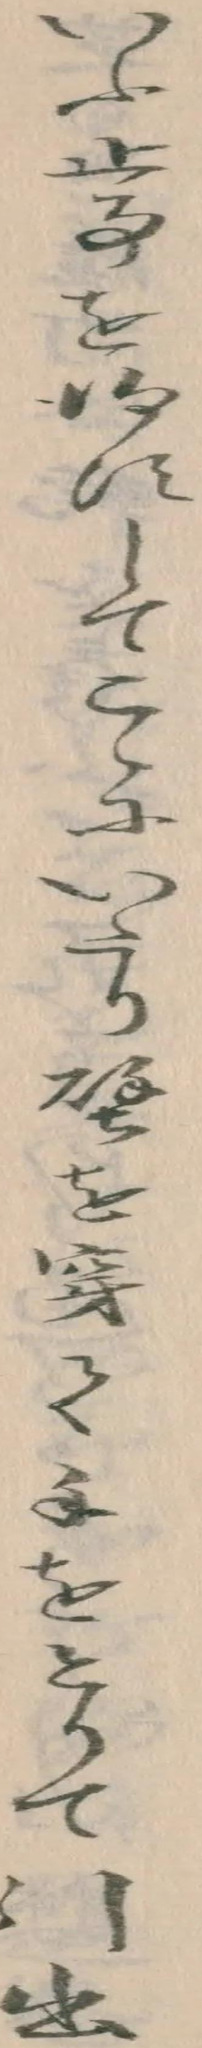いふ止事を得すしてこゝにいたり壁を穿て手をとりて引出
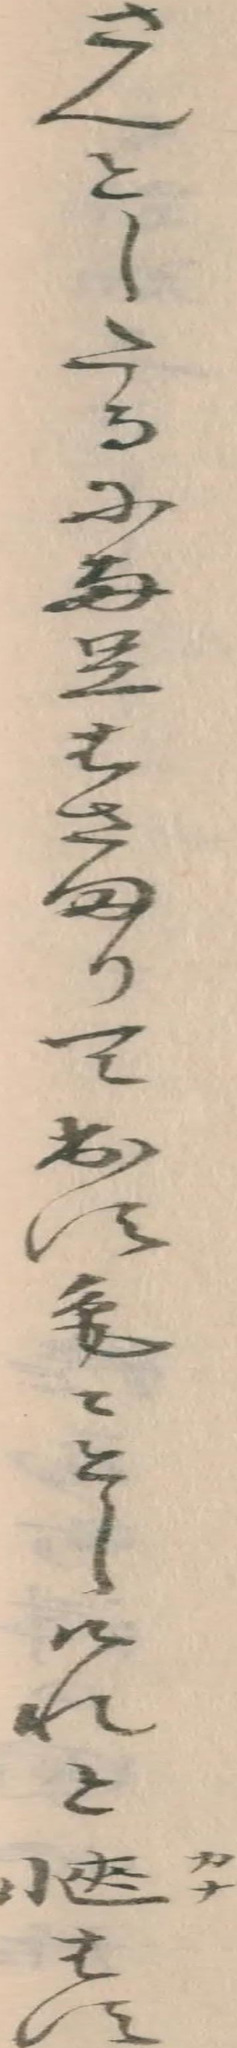さんとしたるに両足はさまりて出す色々としけれと愜はす
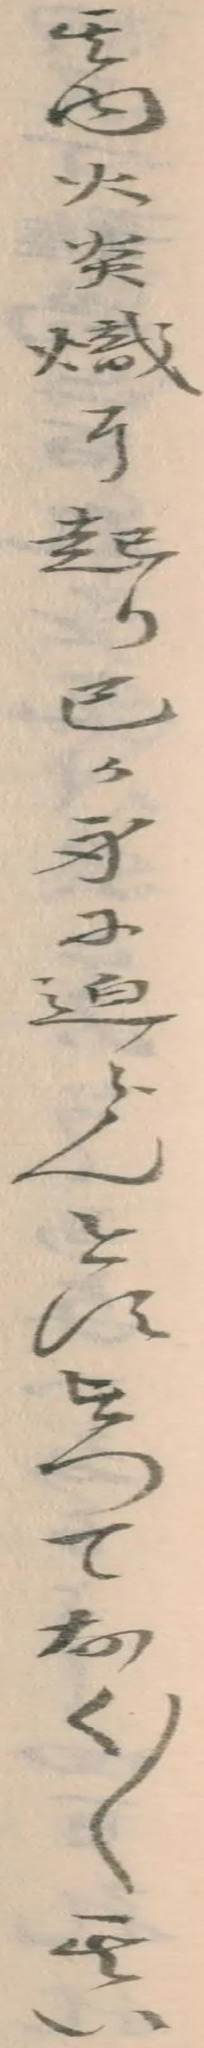其内火炎̪熾に起り己か身に迫らんとすよつてなく〳〵其い
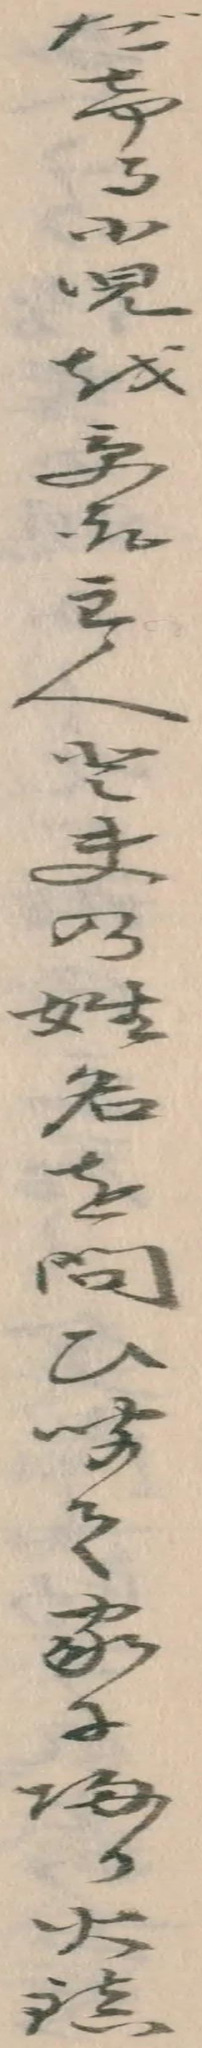だける小児を受取主人と夫の姓名を問ひ聞て家に帰り火鎮
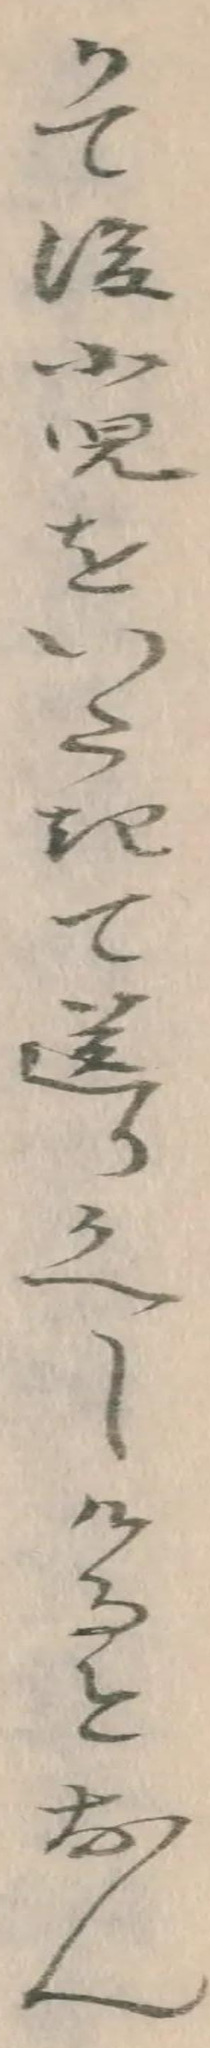りて後小児をいたきて送りかへしけるとなん
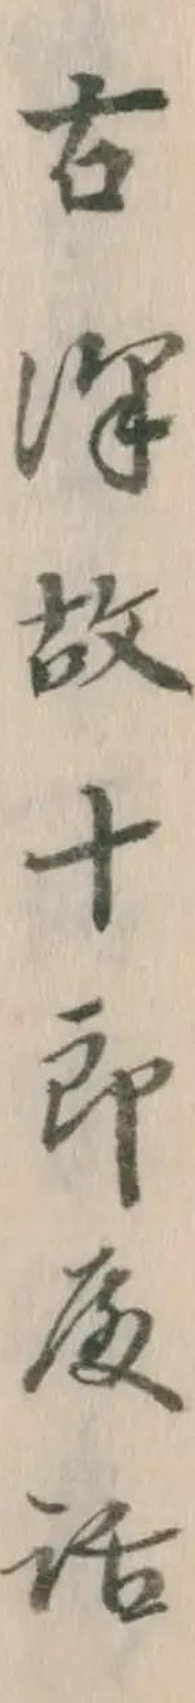古沢故十郎殿話
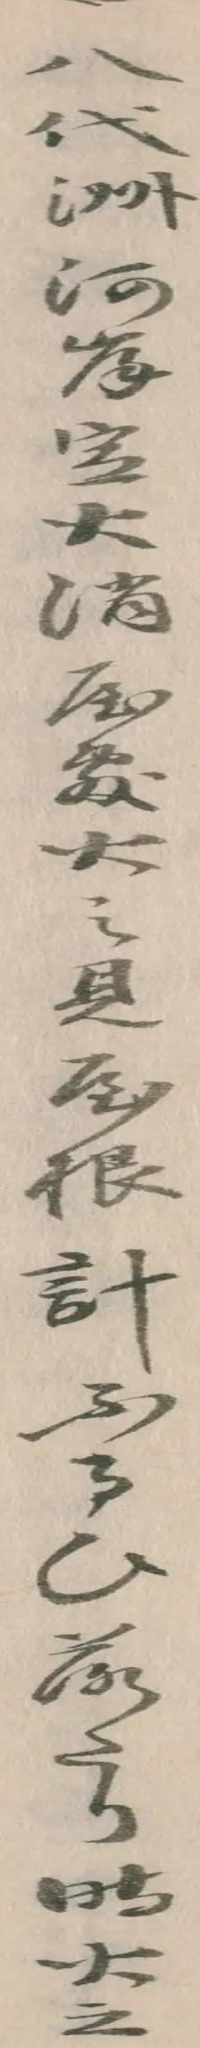〇八代洲河岸定火消屋敷火之見屋根計ふるひ落たり時火之
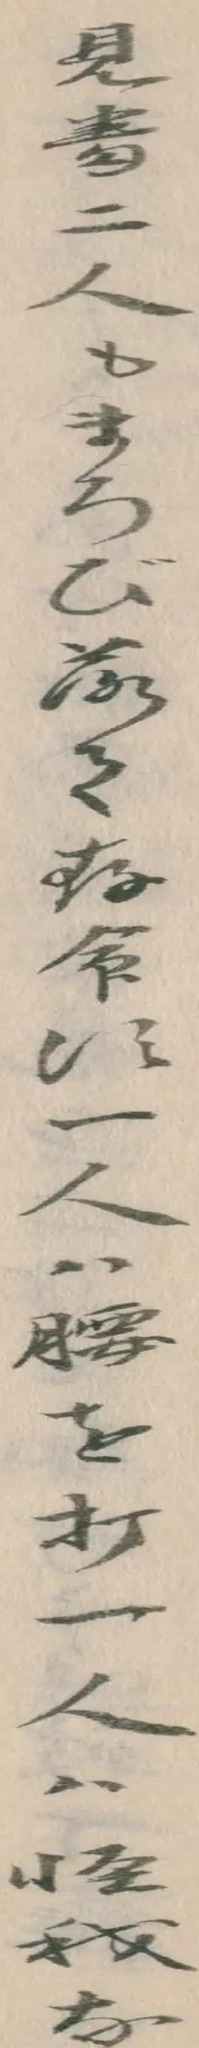見番二人もまろび落て存命す一人は腰を打一人は怪我な
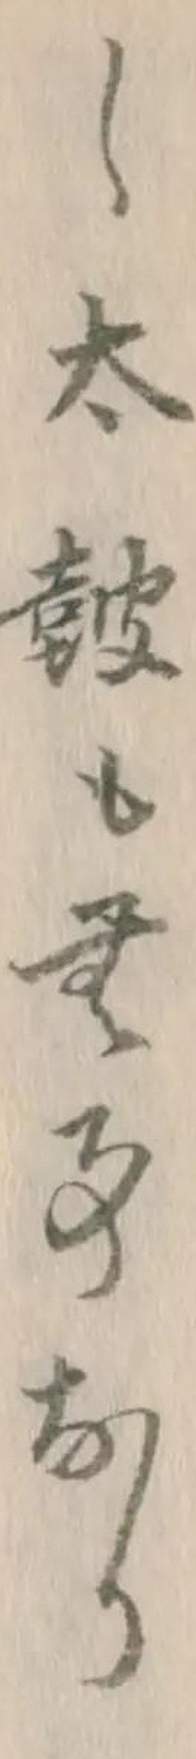し太鼓も無事なり
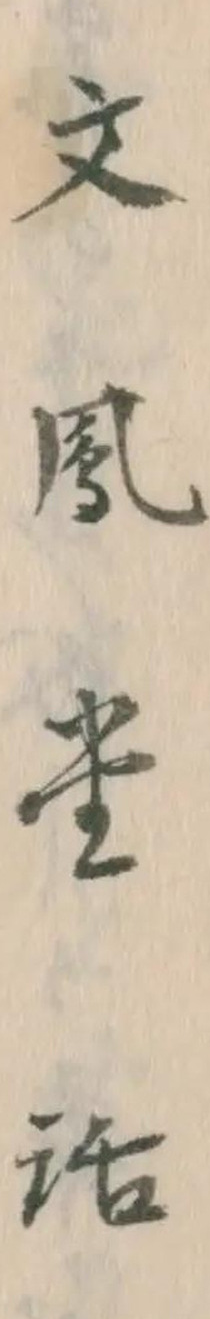文鳳堂話
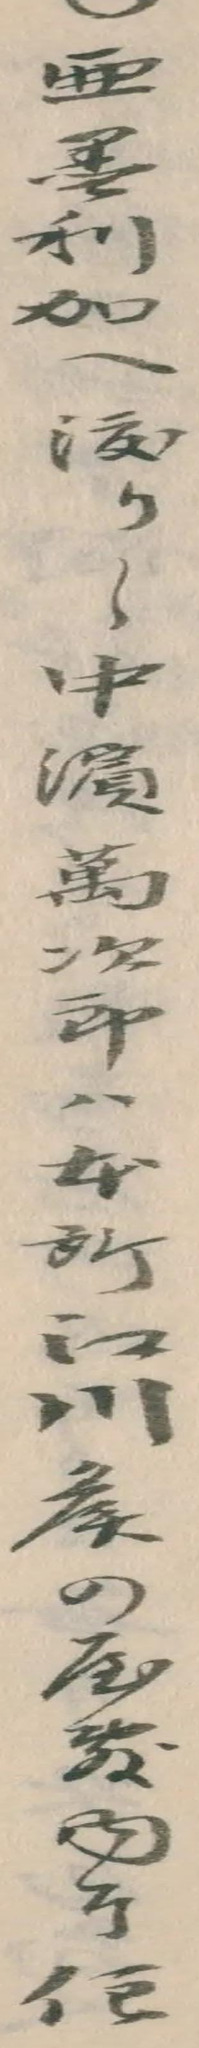〇亜墨利加へ渡りし中浜万次郎は本所江川侯の屋敷内に住
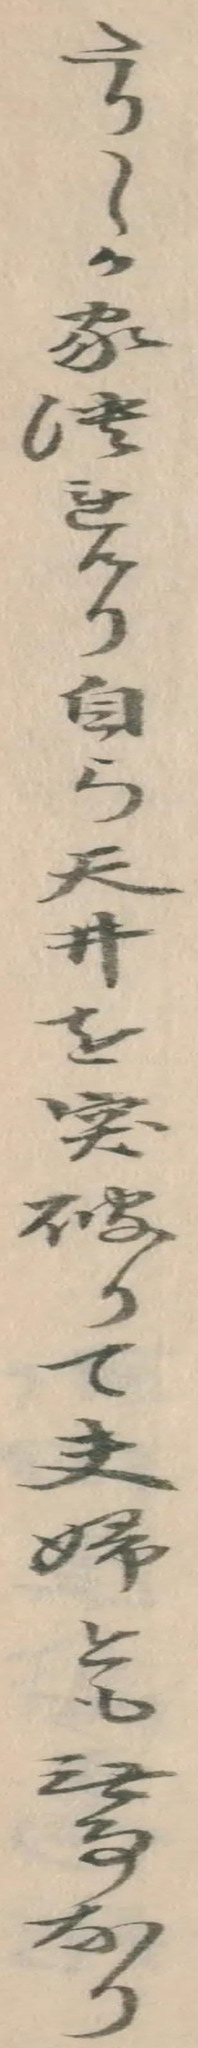たりしか家潰れけり自ら天井を突破りて夫婦とも無事なり

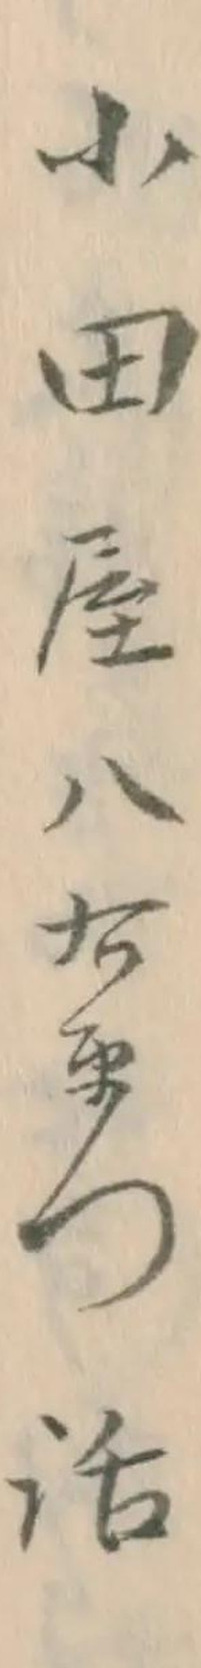小田屋八右衛門話
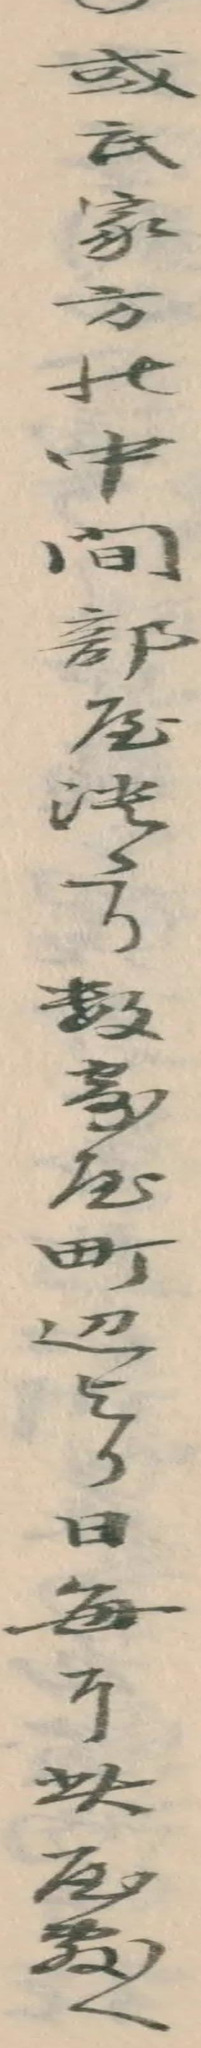〇或武家方の中間部屋潰たり数寄屋町辺より日毎に此屋敷へ
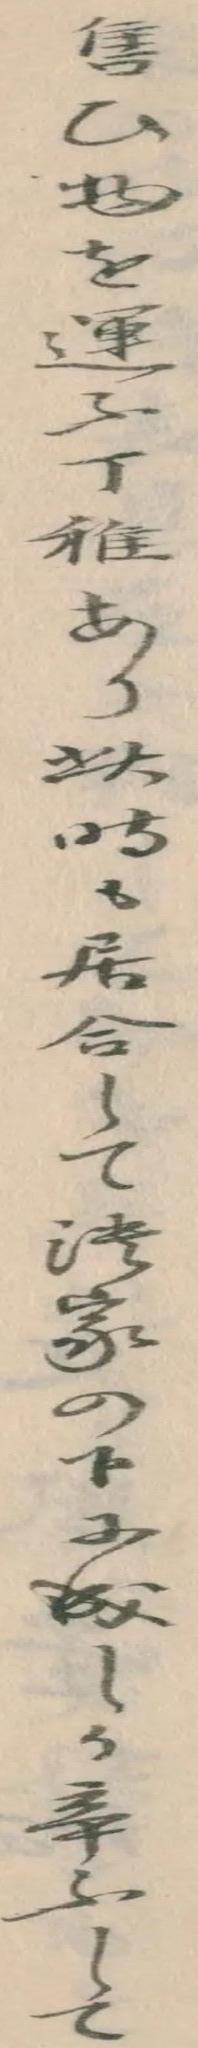售ひ物を運ふ丁稚あり此時も居合して潰家の下に成しか辛ふして
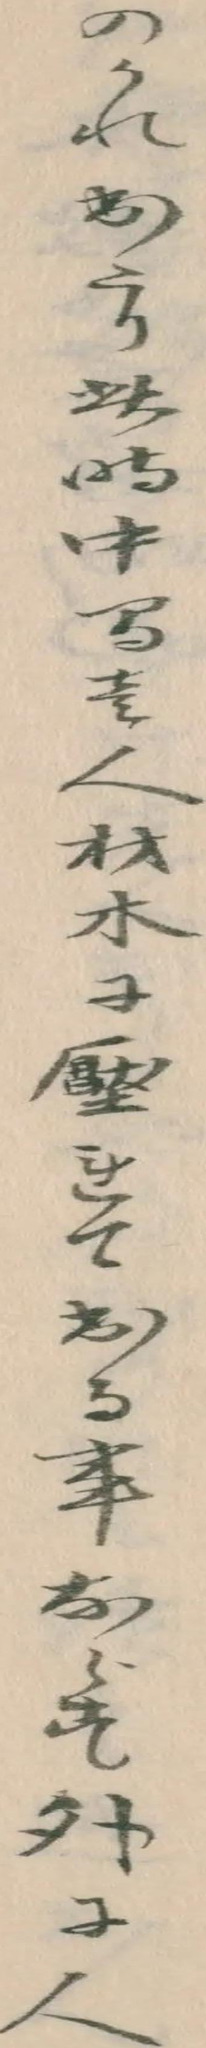のかれ出たり此時中間壱人材木に圧れて出る事ならす外に人
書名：地災撮要. 巻7-9(地震之部)
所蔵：国立国会図書館 National Diet Library, JAPAN
